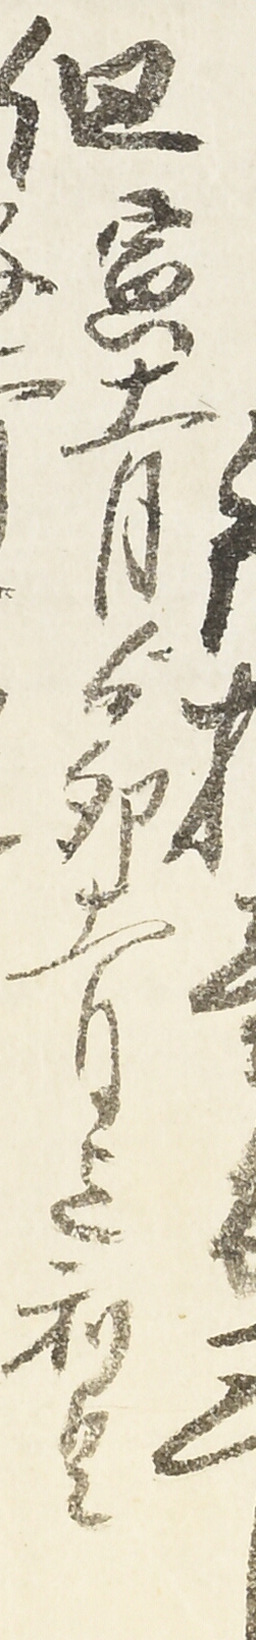但寅十一月ゟ卯十一月迄利足
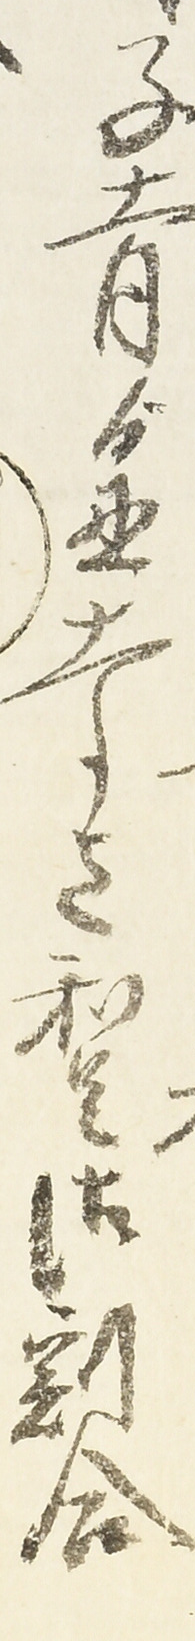子十一月ゟ丑ノ十一月迄利足御割合
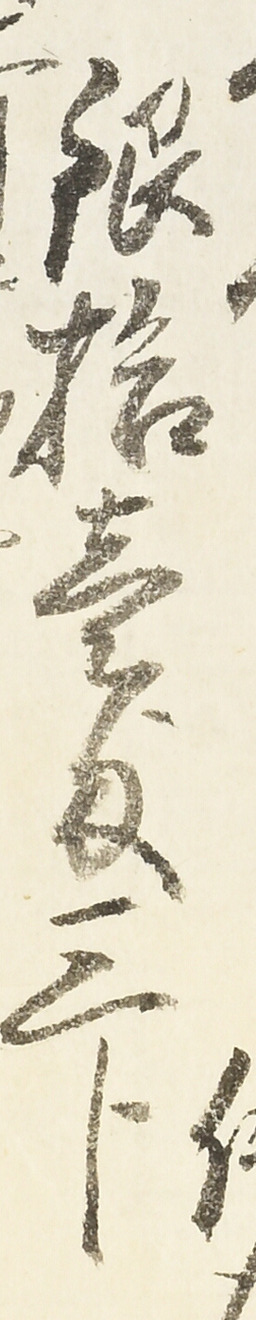銀拾壱匁三分
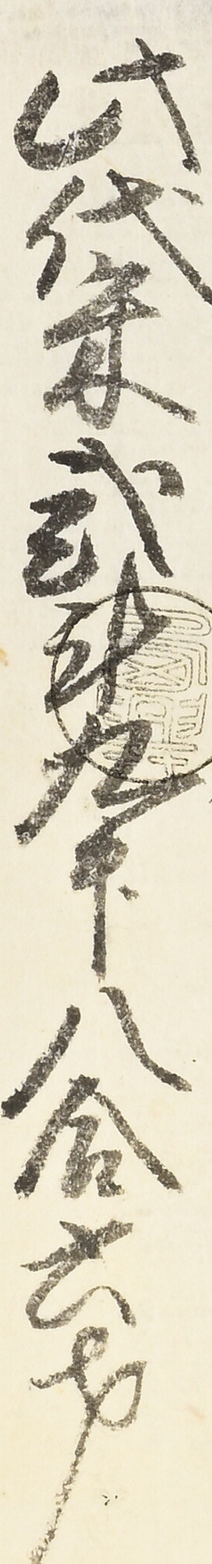此代米弐斗九升八合六才
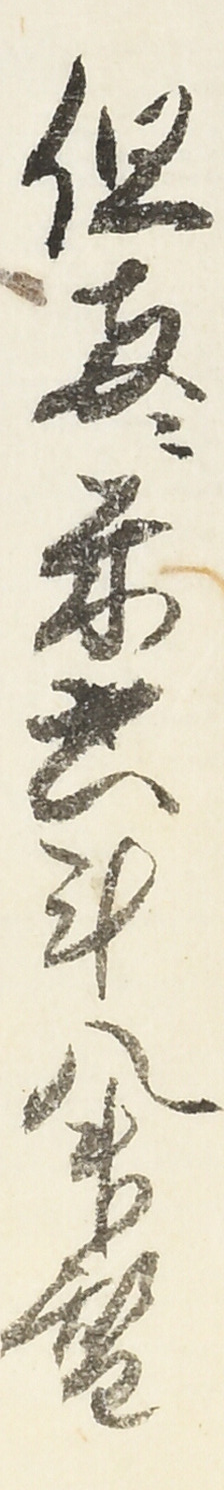但両ニ米六斗八升替
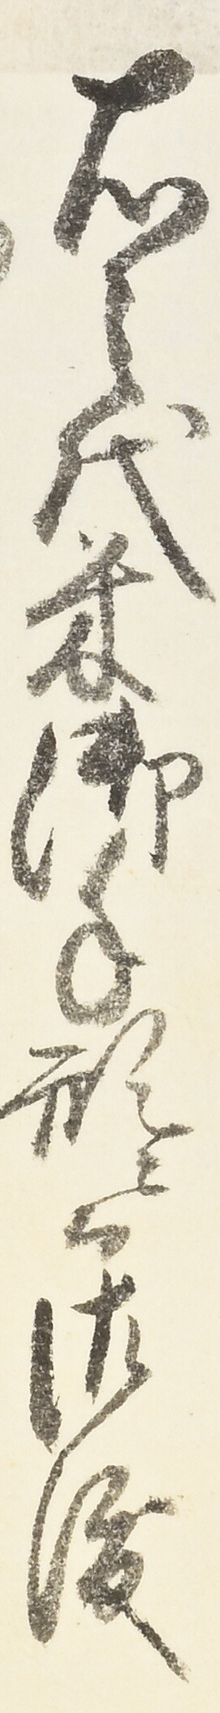右之代米御手形ニ而御渡
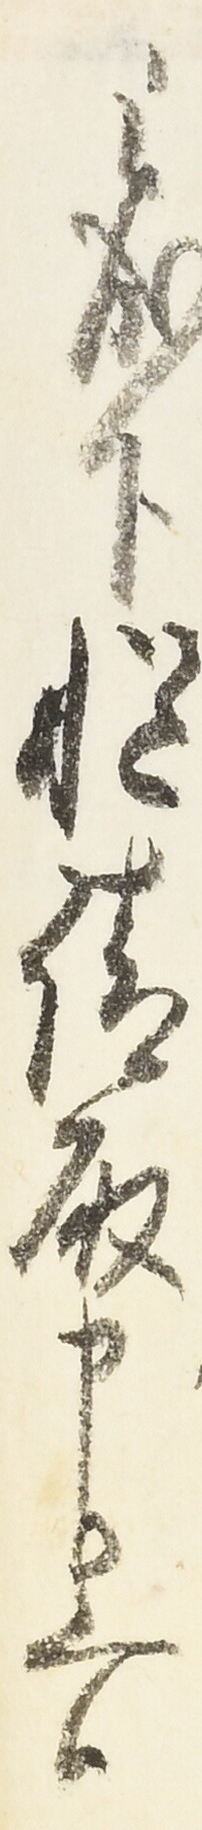被成下慥請取申上候
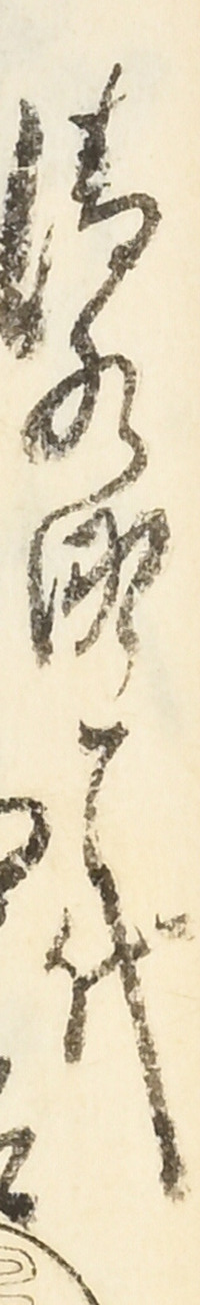清水町中屋
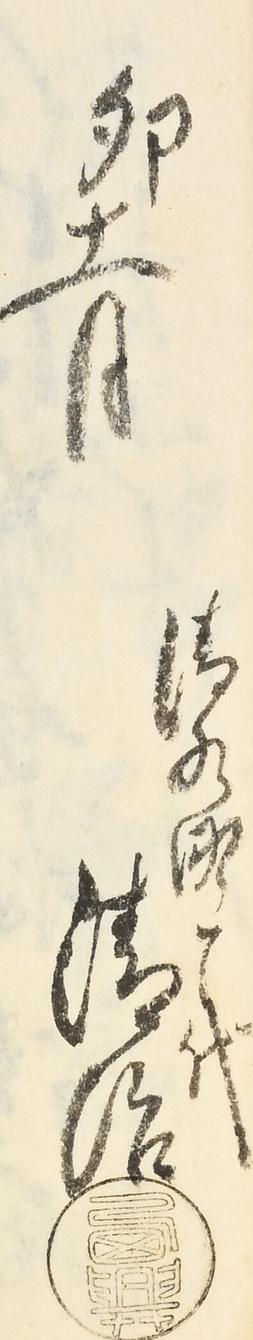卯十一月㐂七

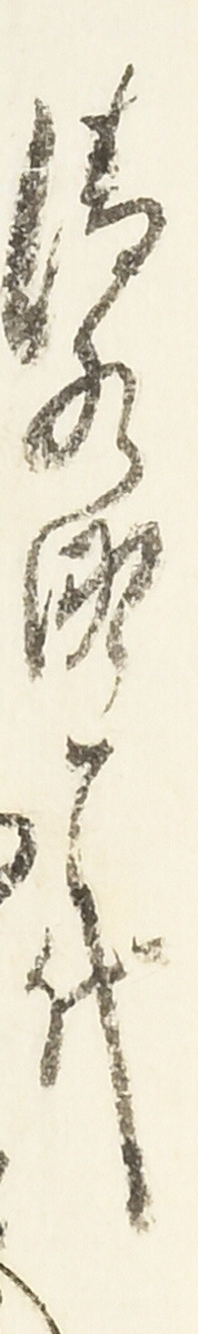清水町丁代
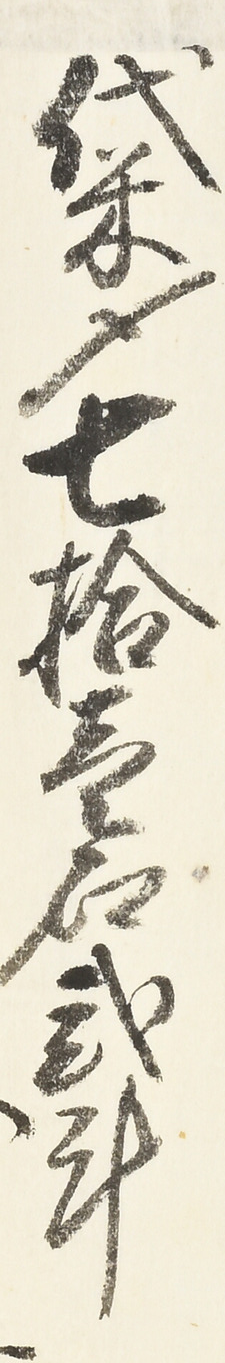此米〆七拾壱石弐斗
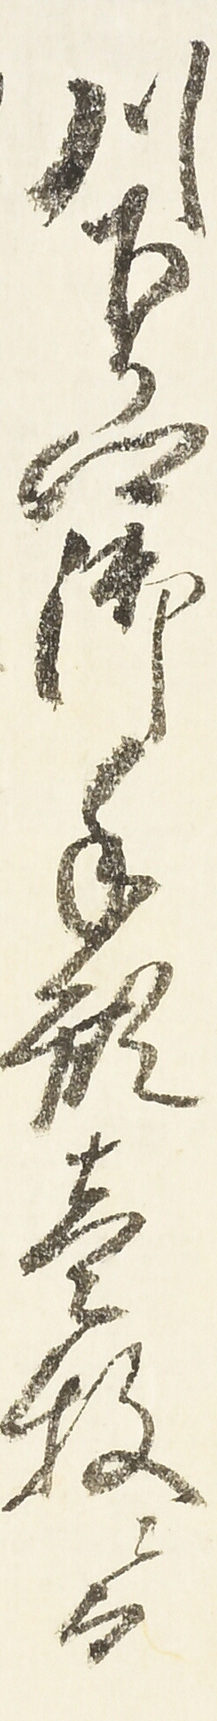川下之郷御手形壱枚ニ而
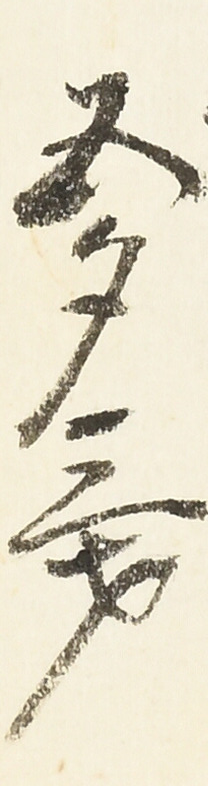五勺三才
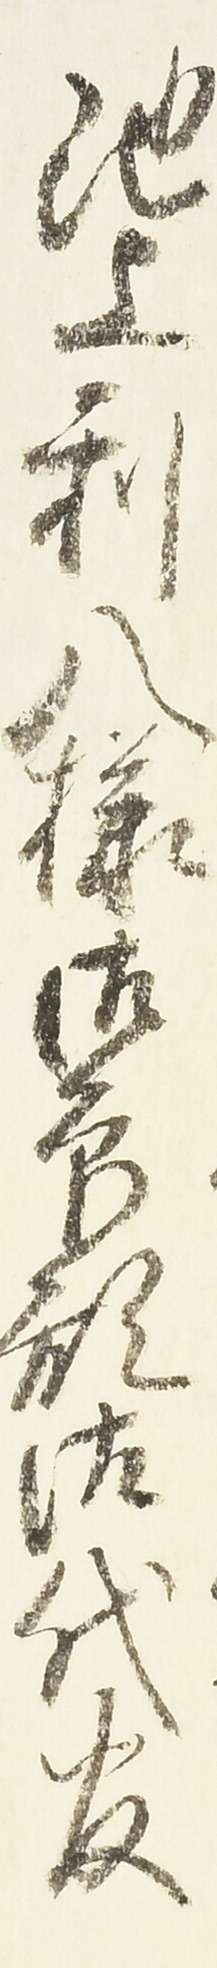池上利八様御印形御代官
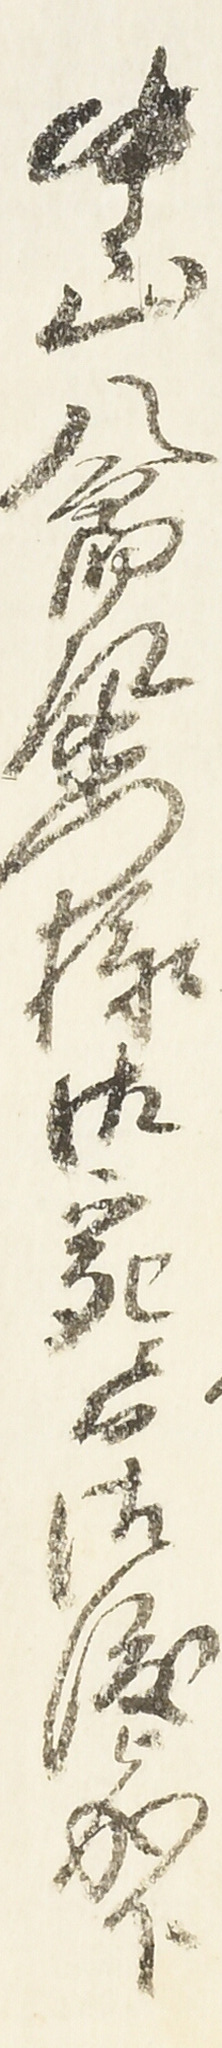中山八郎左衛門様御宛ニ而御渡被成下
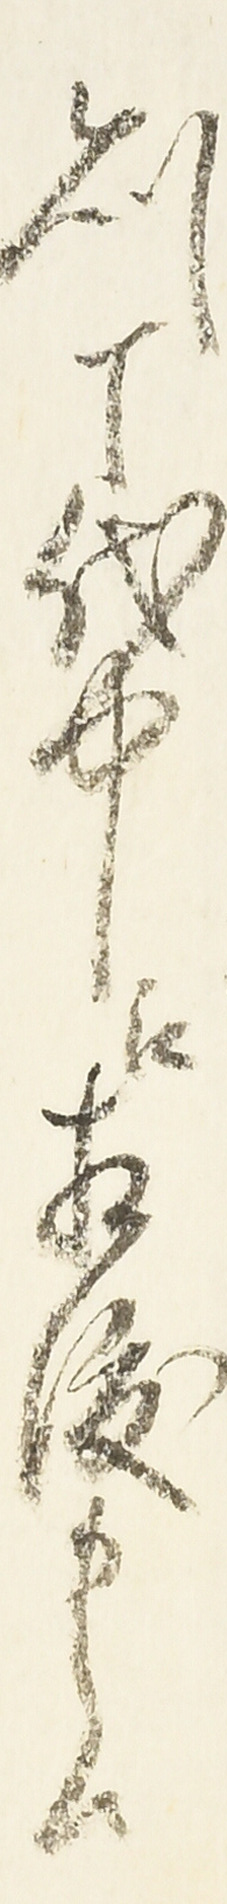則丁代中江相渡申候
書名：御才覚金御利足割渡扣帳
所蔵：伊那市立高遠町図書館・合同会社AMANE
